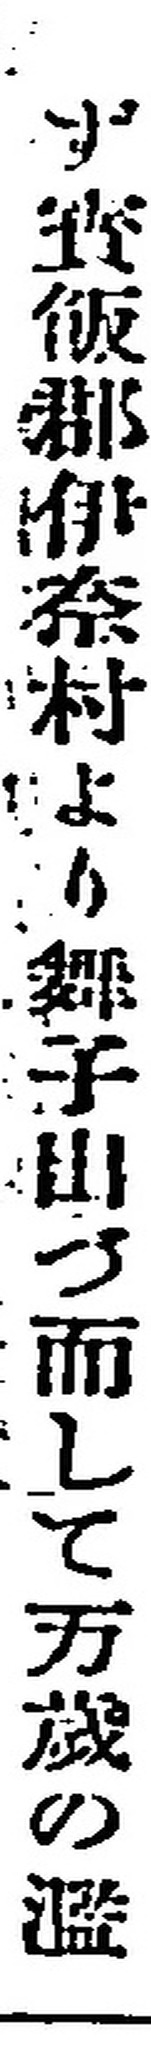ず宝飯郡伊奈村より舞子出づ而して万歳の濫
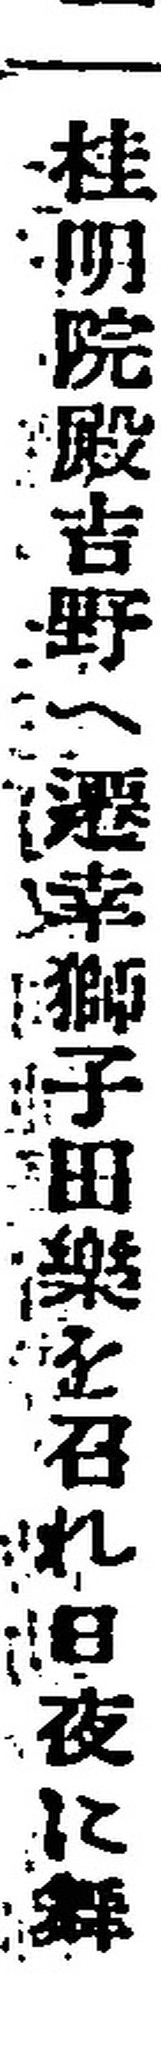桂明院殿吉野へ遷幸獅子田楽を召れ日夜に舞
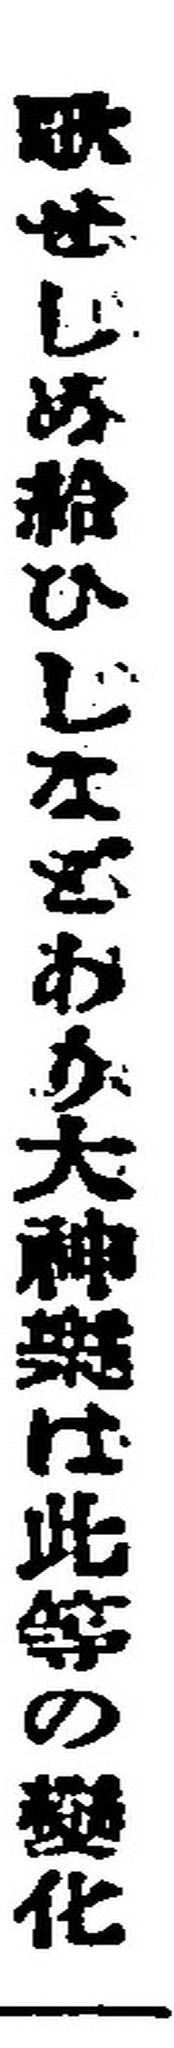歌せしめ給ひしなどあり大神楽は此等の変化
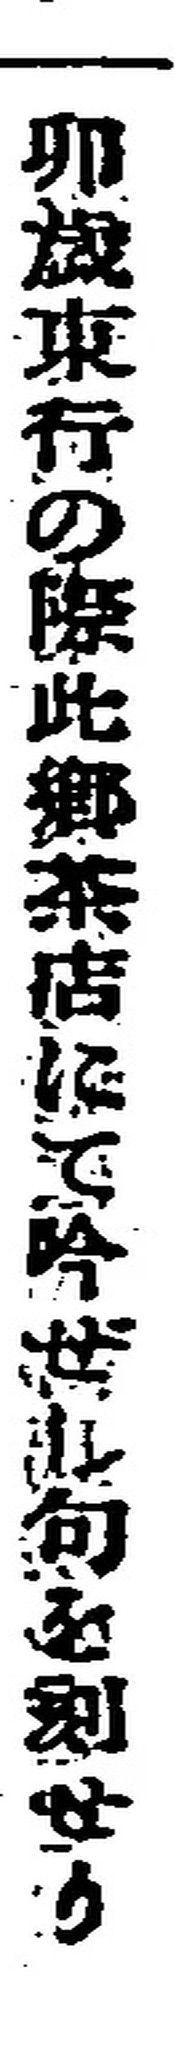卯歳東行の際此郷茶店にて吟ぜし句を刻せり
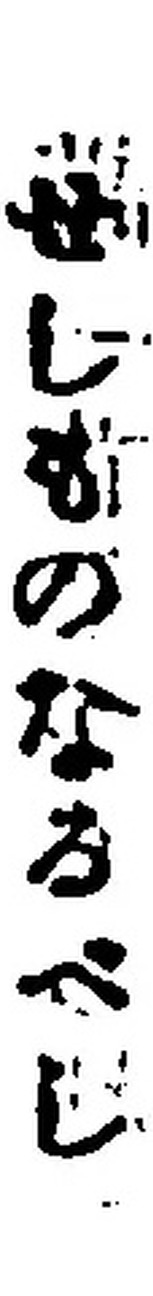せしものなるべし
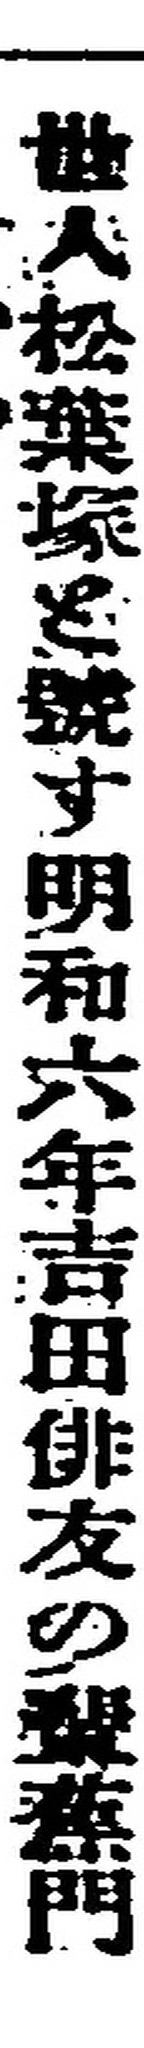世人松葉塚と号す明和六年吉田俳友の輩蕉門
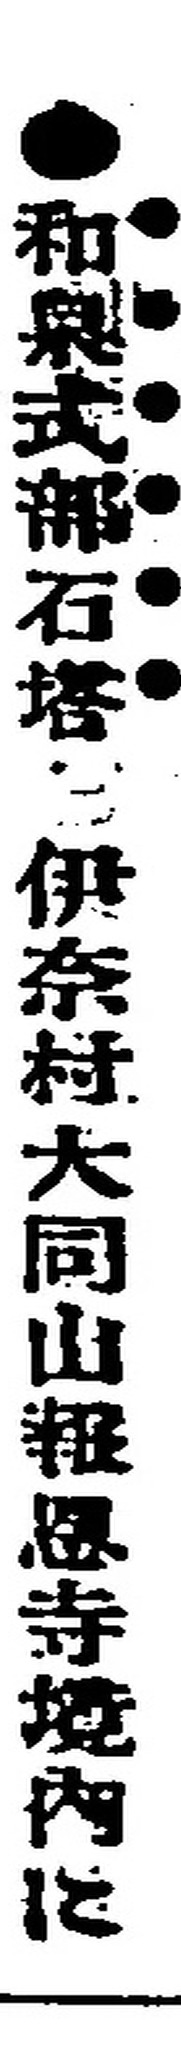●和泉式部石塔伊奈村大同山報恩寺境内に
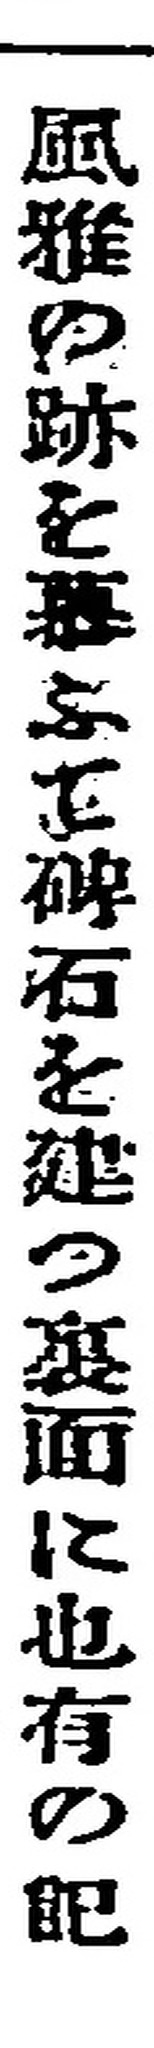風雅の跡を慕ふて碑石を建つ裏面に也有の記
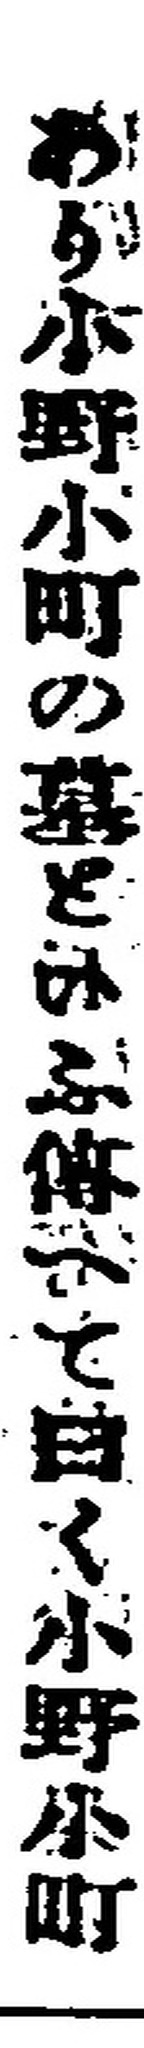あり小野小町の墓といふ伝へて曰く小野小町
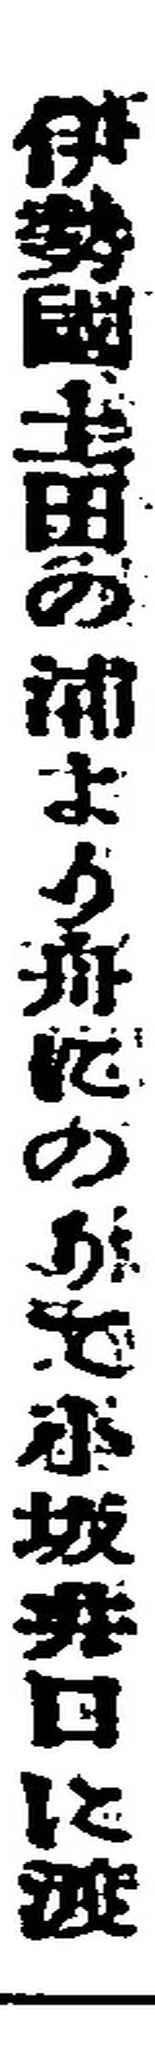伊勢国土田の浦より舟にのりて小坂井口に渡
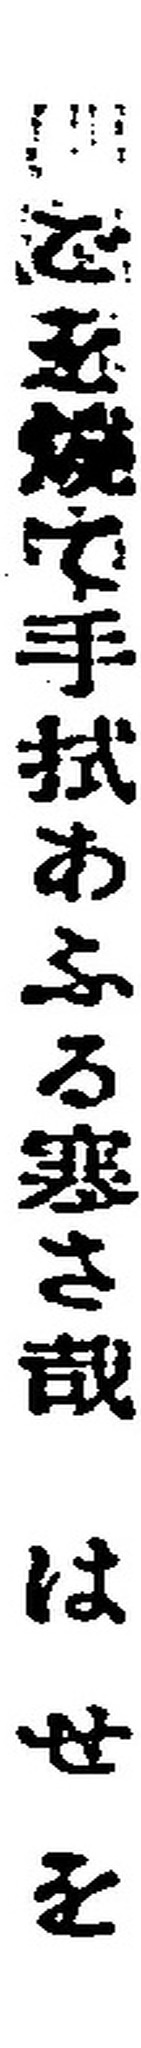ごを焼て手拭あふる寒さ哉はせを
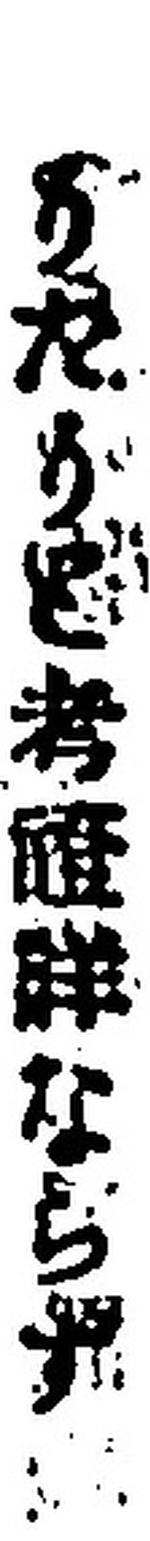りたりと考証詳ならず
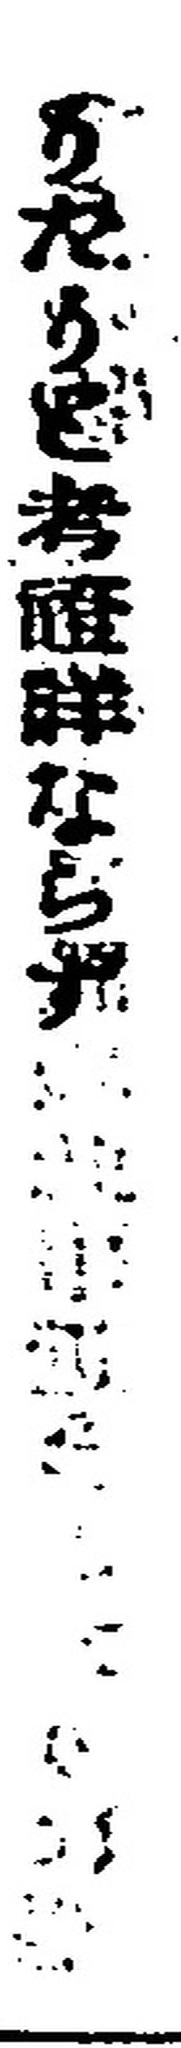りたりと考証詳ならず
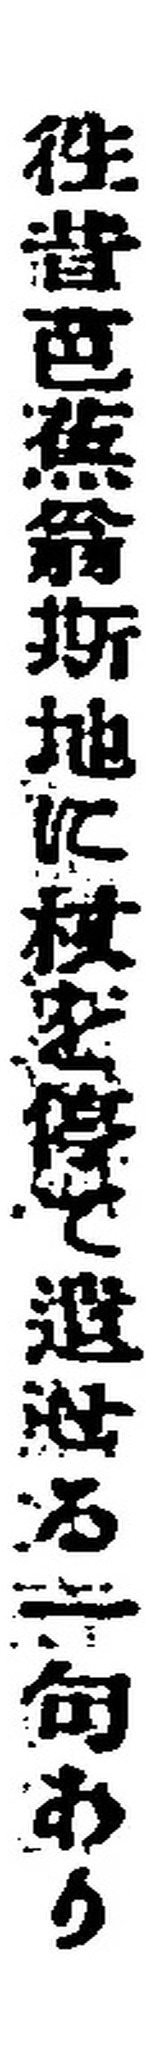往昔芭蕉翁斯地に杖を停て遺せる一句あり
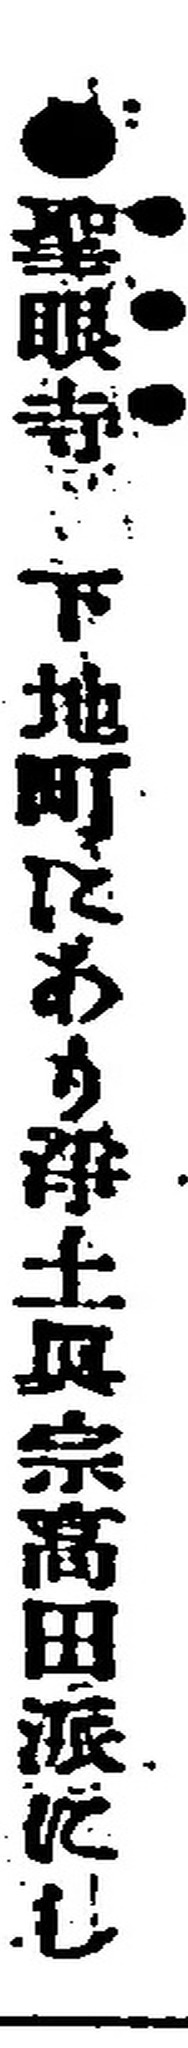●聖眼寺下地町にあり浄土真宗高田派にし
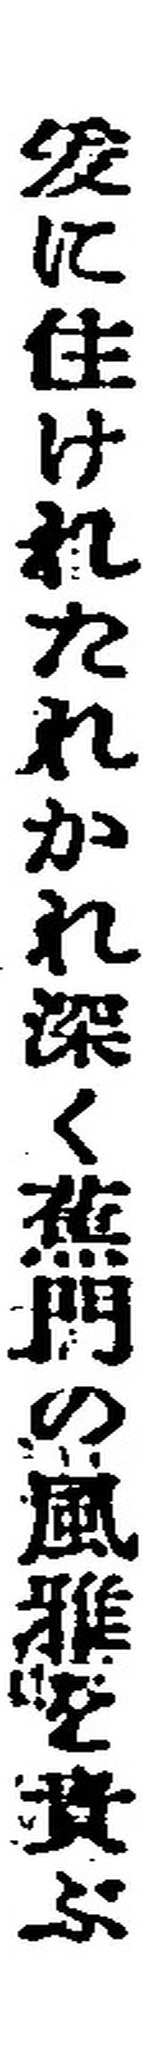爰に住けれたれかれ深く蕉門の風雅を貴ぶ
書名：東参名勝案内
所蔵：国立国会図書館 National Diet Library, JAPAN
